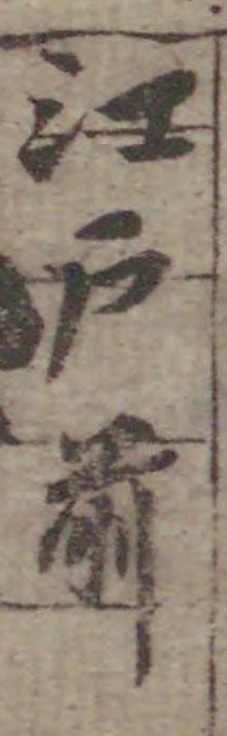江戸前

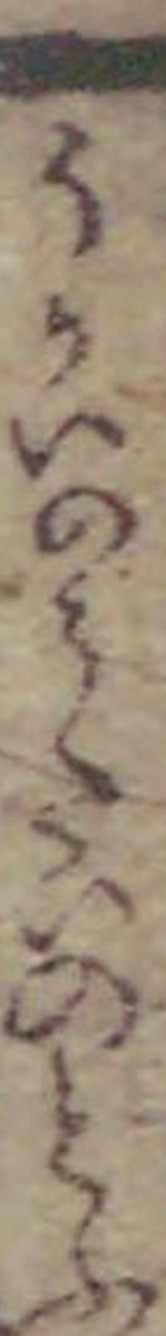うかいのうたいのとふり
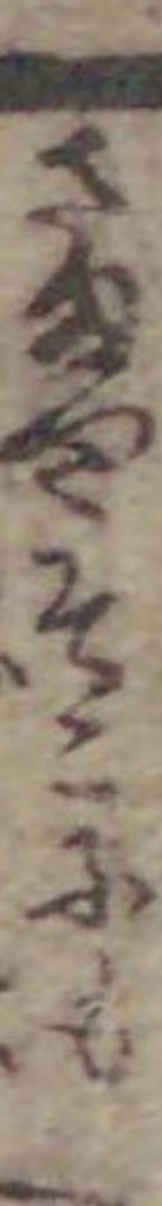さまやそこにも
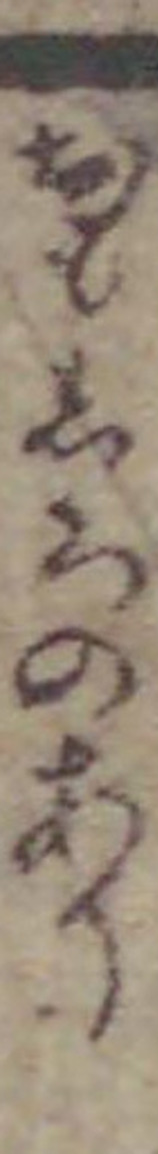おもしろのあり
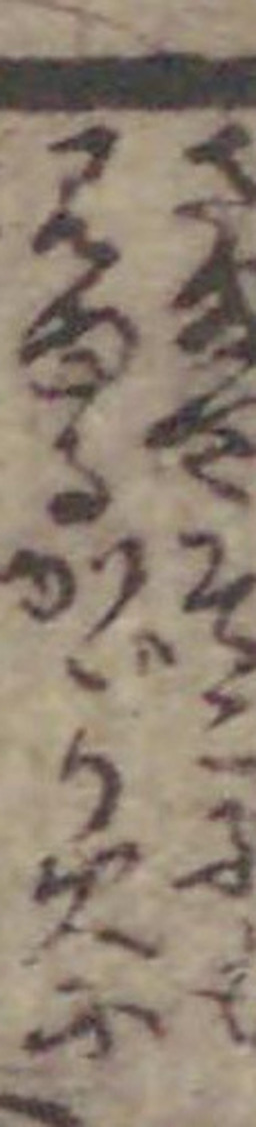見ゆるかゞり火に
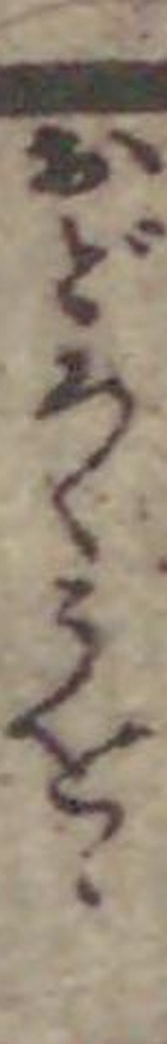おどろくうをゝ
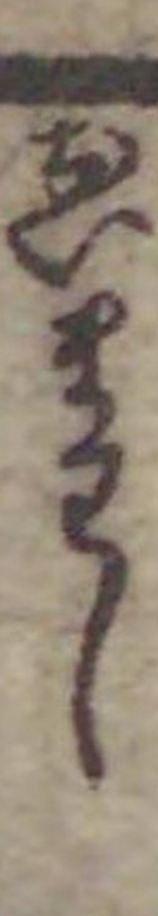おいまわし
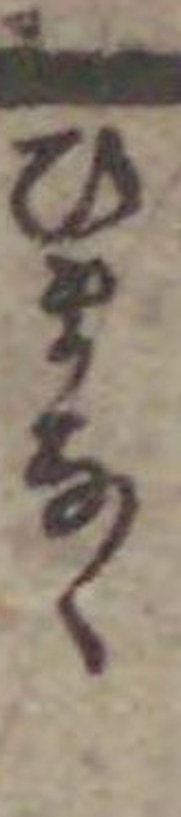ひまなく
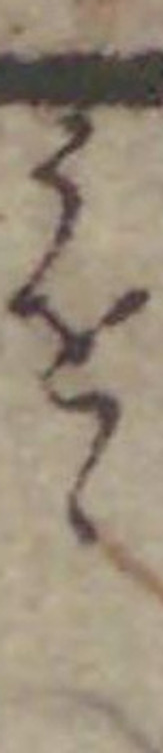うをゝ
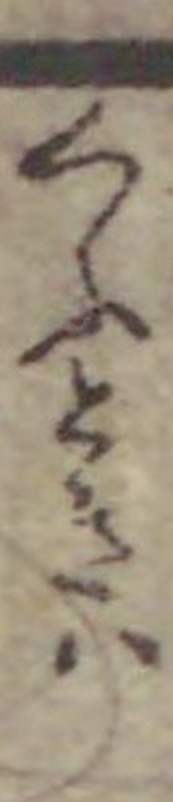くふときハ
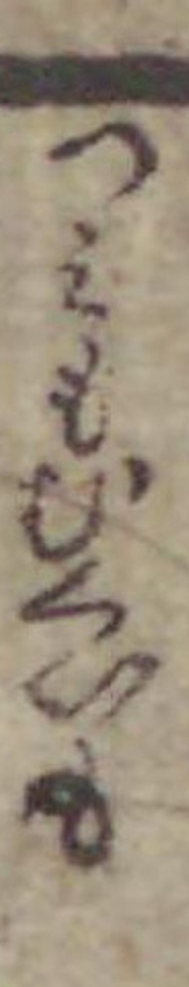つミもむくひも
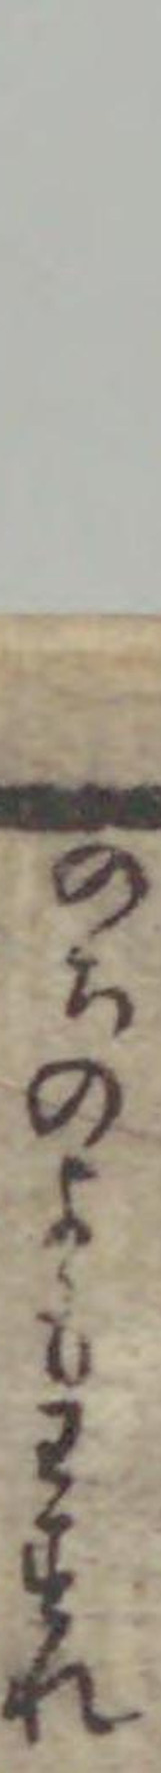のちのよもわすれ
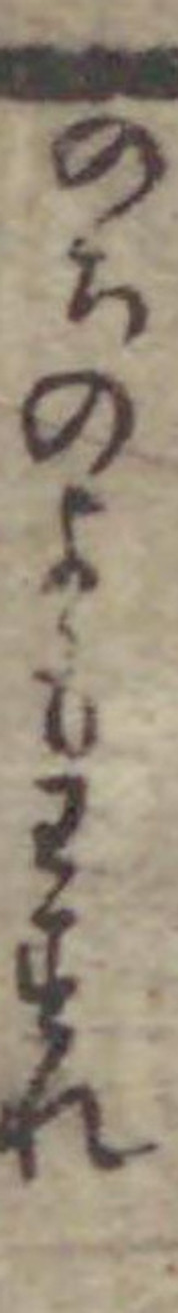のちのよもわすれ
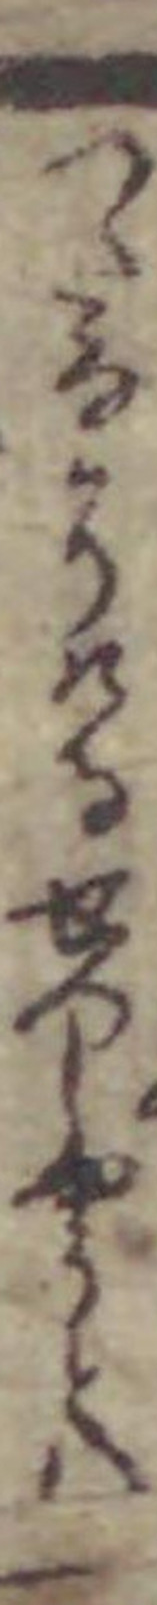つたなかりけるせつしやうとハ
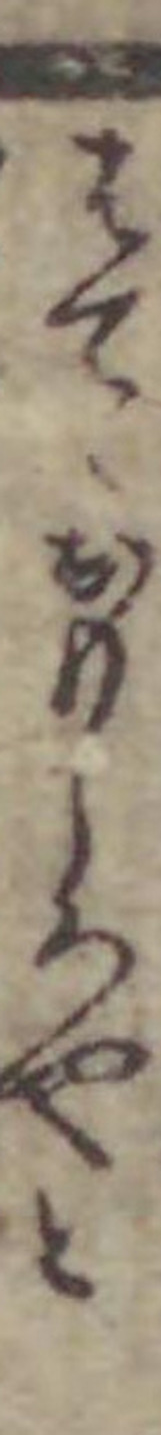はてゝおもしろやと
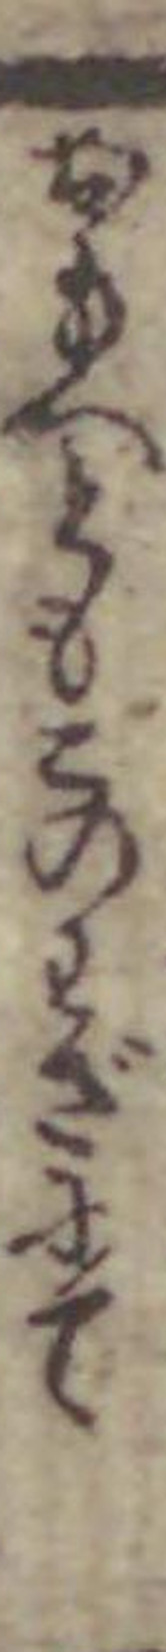おもへともこのわざにて
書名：烏行水諺草 3巻
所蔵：国立国会図書館 National Diet Library, JAPAN
